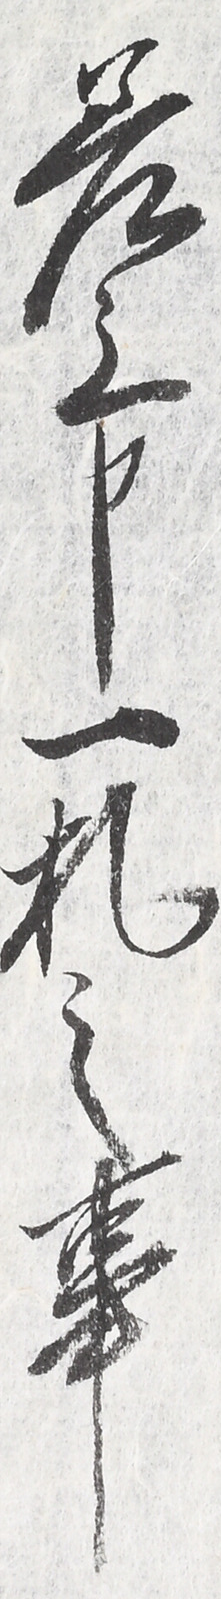差上申一札之事
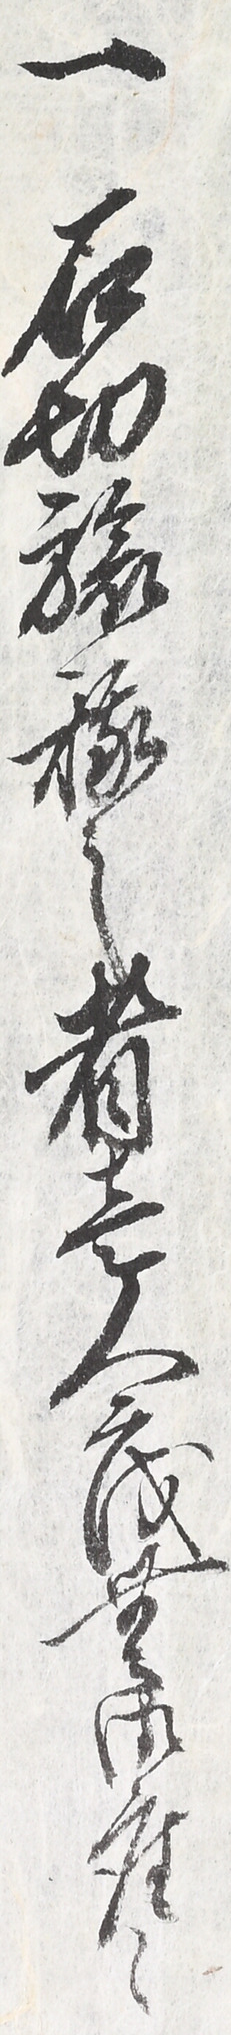一石切旅稼之者壱人茂無御座候
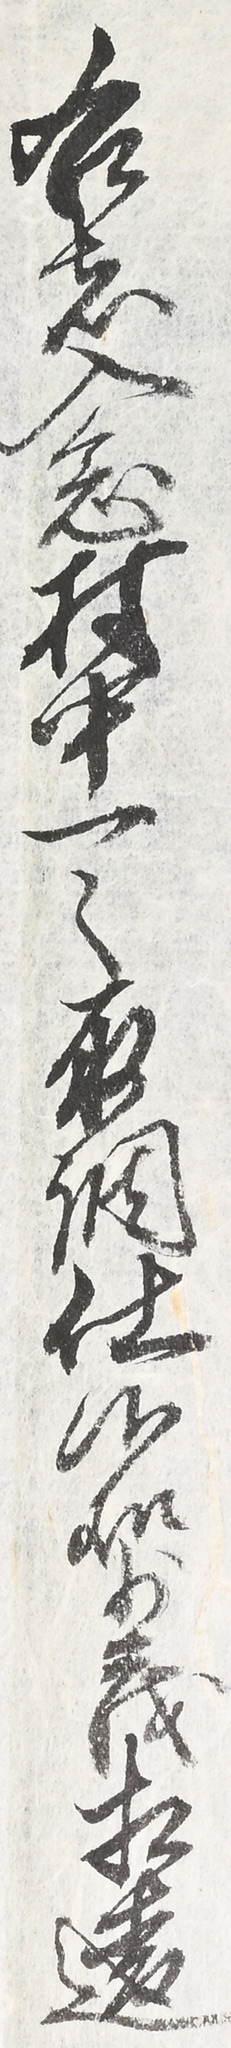右者入念村中一々取調仕候処少茂相違
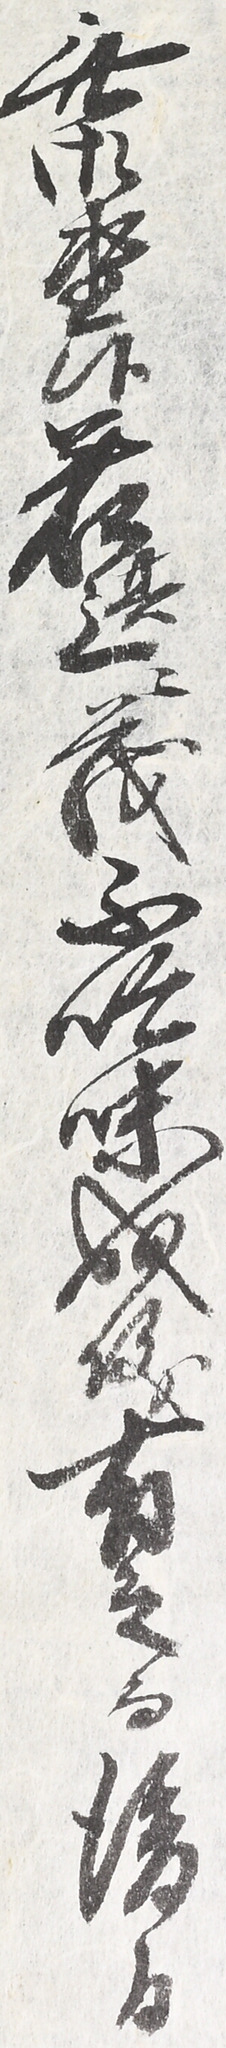無御座候若其上ニ茂不吟味成儀有之而後日
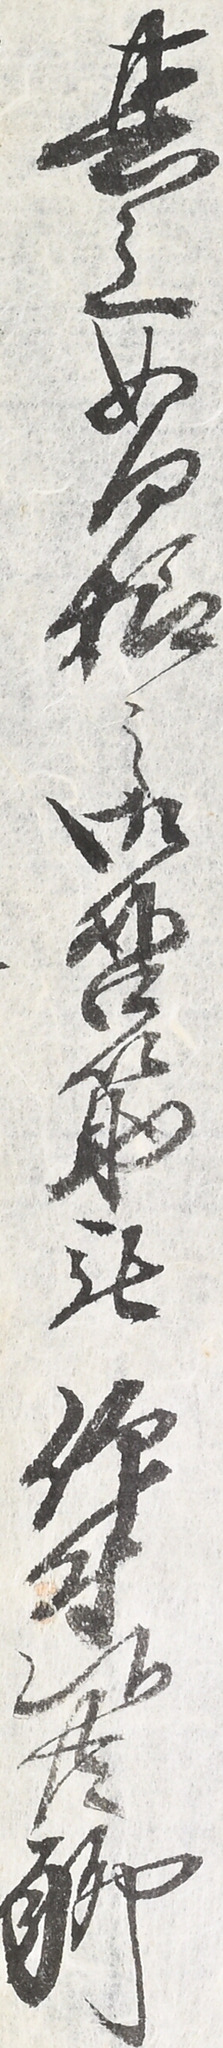其上如何様之御咎筋被仰付候共聊
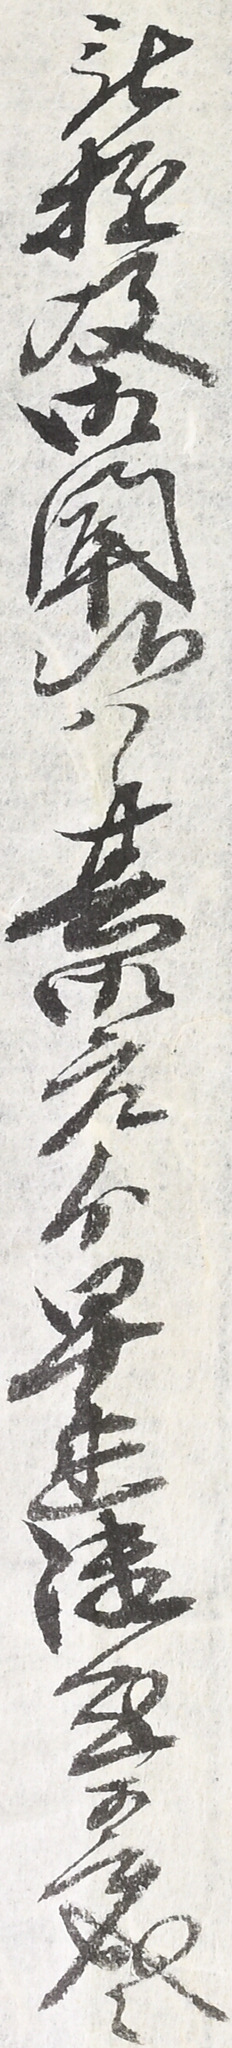被遊及御聞候ハヽ其御元ゟ早速注進可被成候
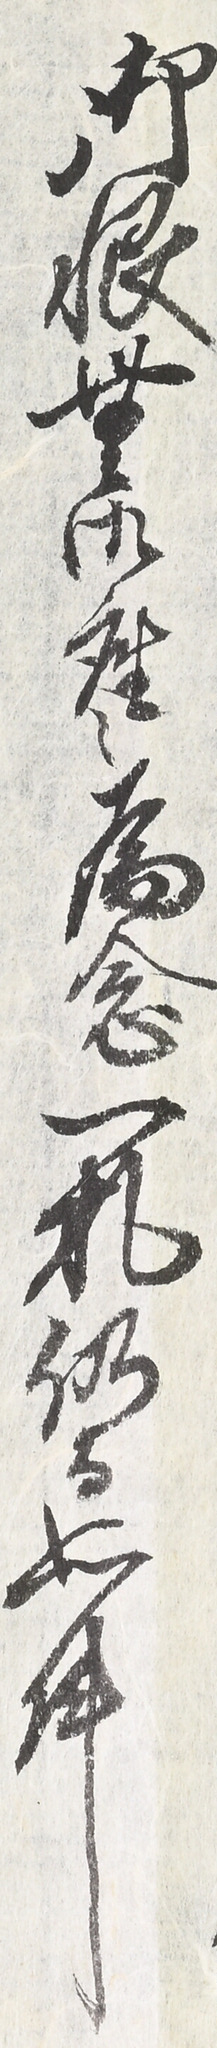御恨無御座候為念一札仍而如件
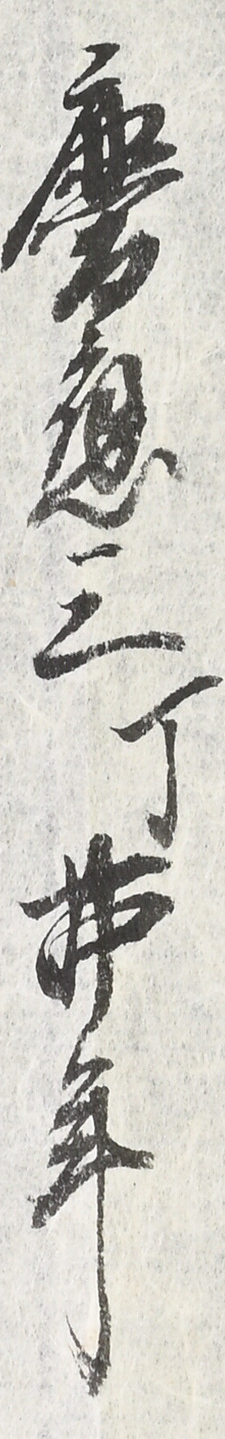慶応三丁卯年
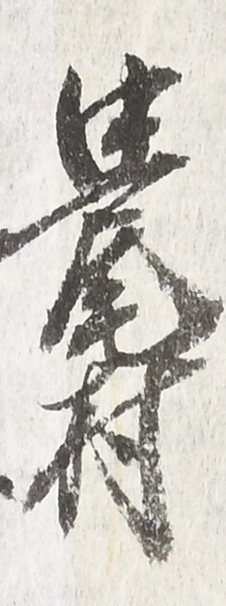中尾村
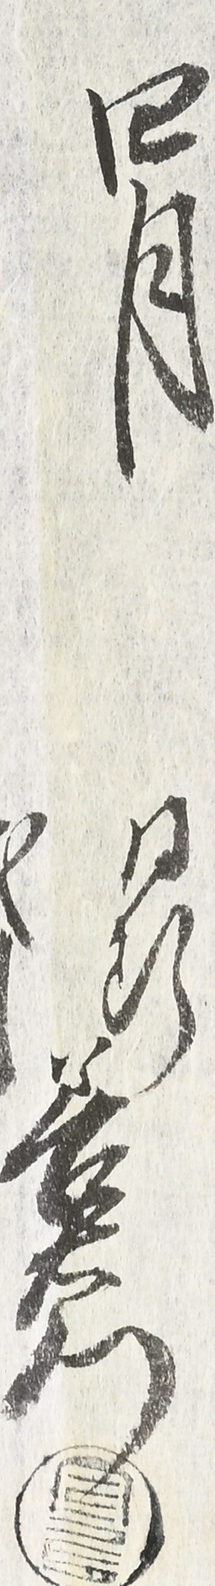同断善右衛門
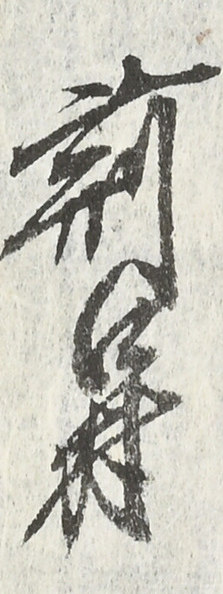荊口村
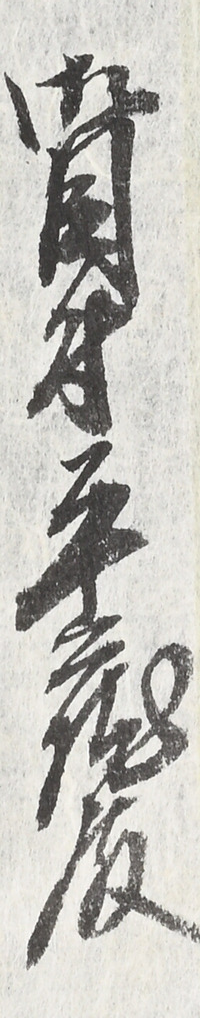御目付平蔵殿
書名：差上申一札之事
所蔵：伊那市立高遠町図書館・合同会社AMANE
